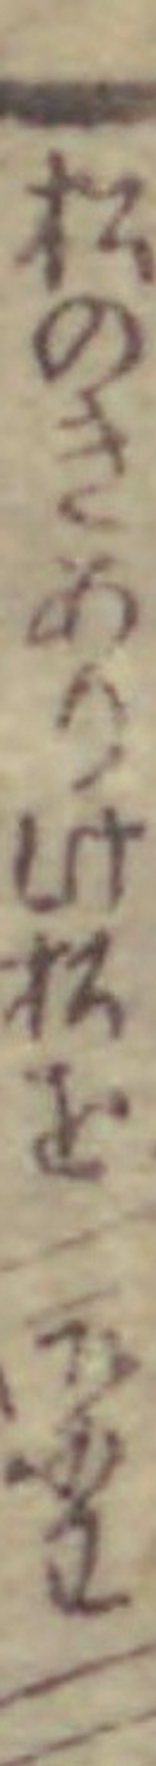松のきあり此松を御にわ
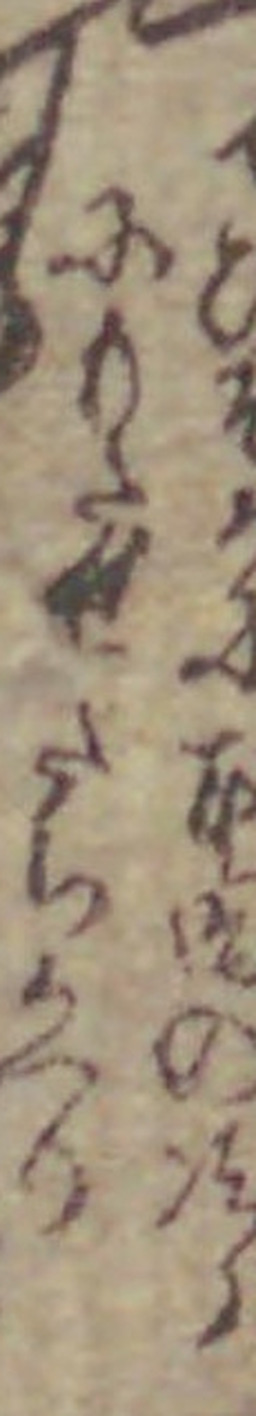にもたせたちかへり
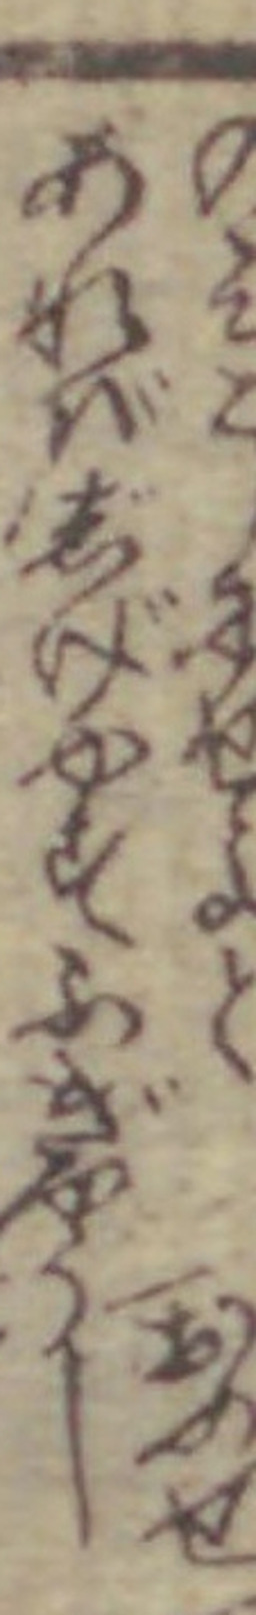あればしげやすふぎやうし

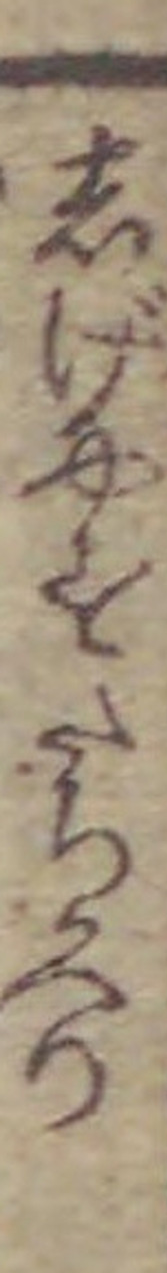しげやすたちかへり
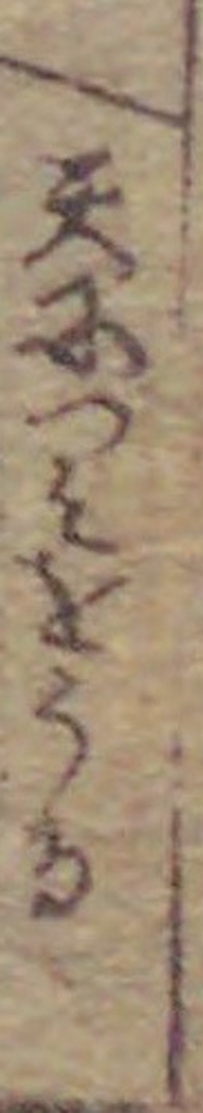天につみをうる
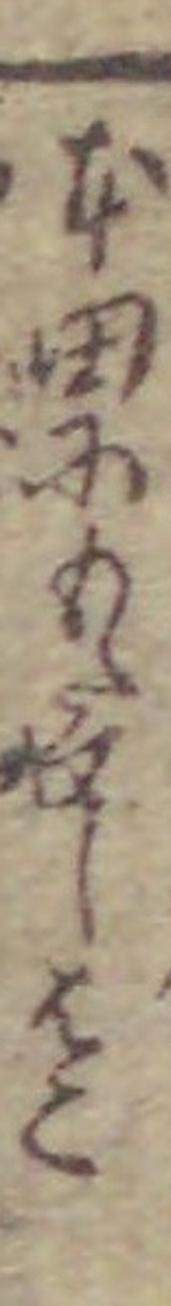本田にもたせしはこ
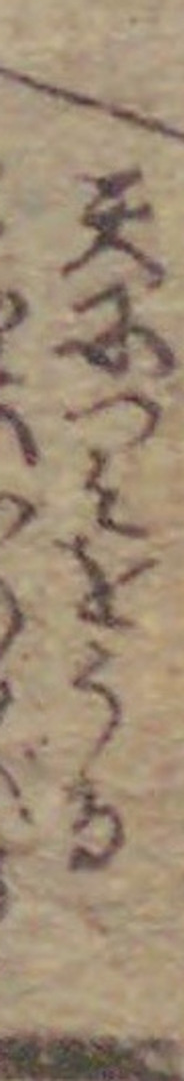天につみをうる
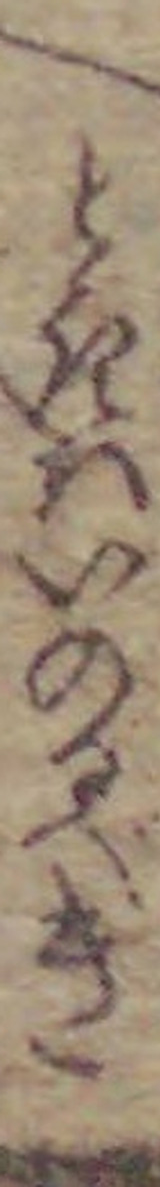ときはいのるべき
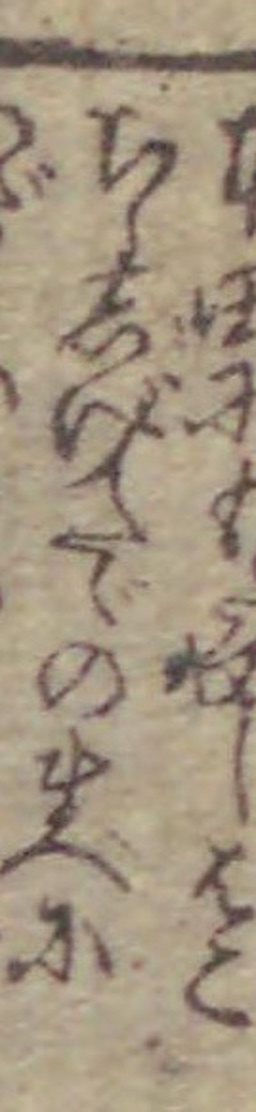ちゝしげたゞのまへに
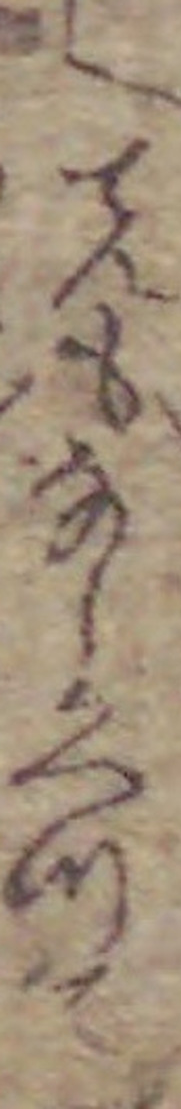てんもなくかへつて
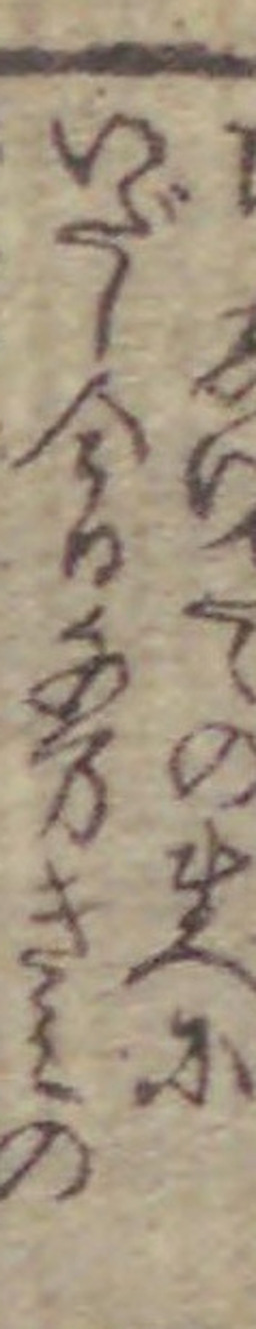いだし今日千万きみの
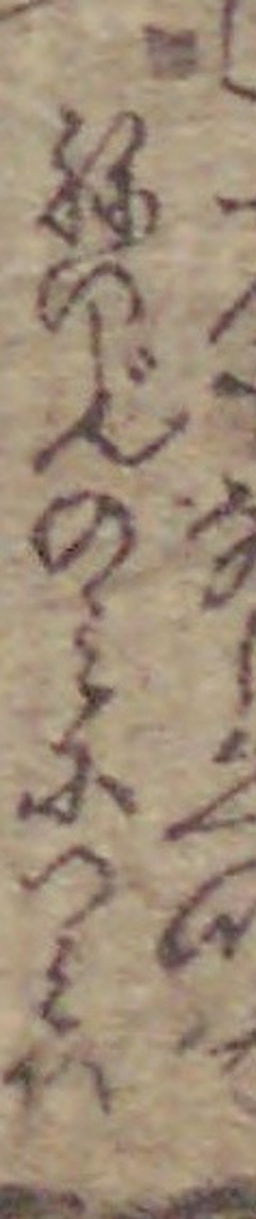ねいじんのみにつみは
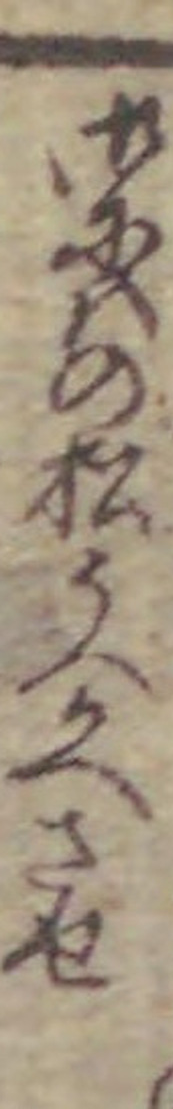御にはの松うへかへさせ
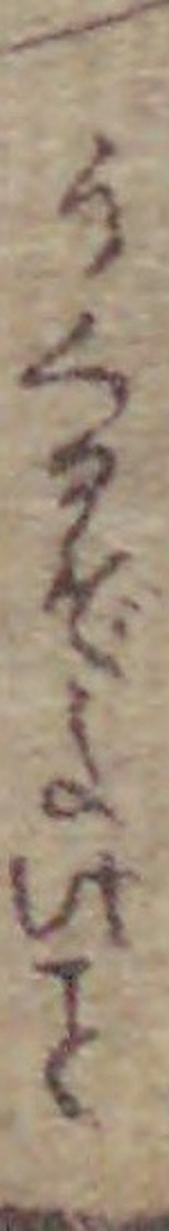うくるぞよ此こと
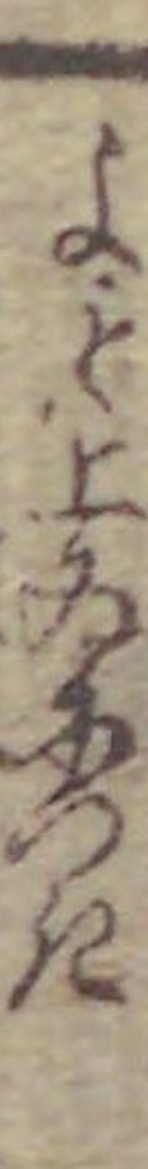よと上ゐにつき
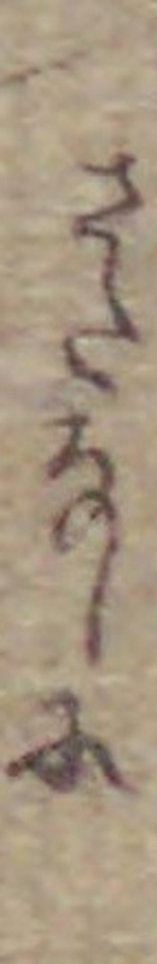さたなしに
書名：鎌倉山紅葉浮名
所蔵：国立国会図書館 National Diet Library, JAPAN
